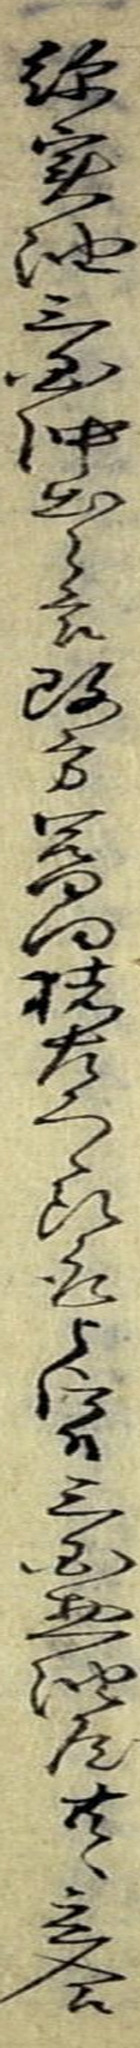綿実油三国沖出之節改方富田猪左衛門頭取被仰付三国惣油屋共へ立合
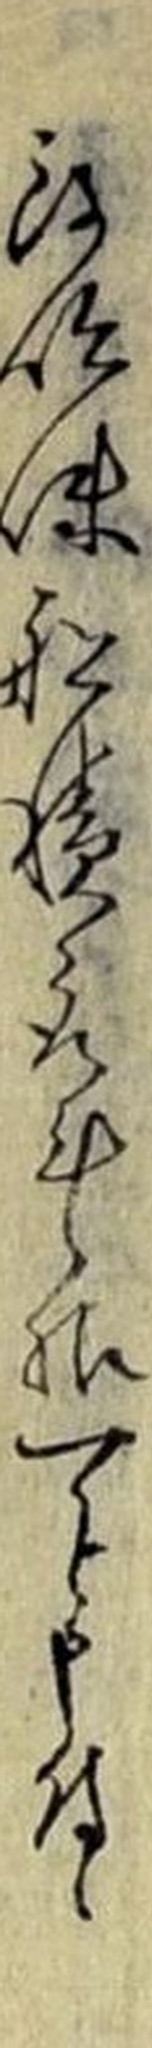致吟味船積取斗候様可被申付候
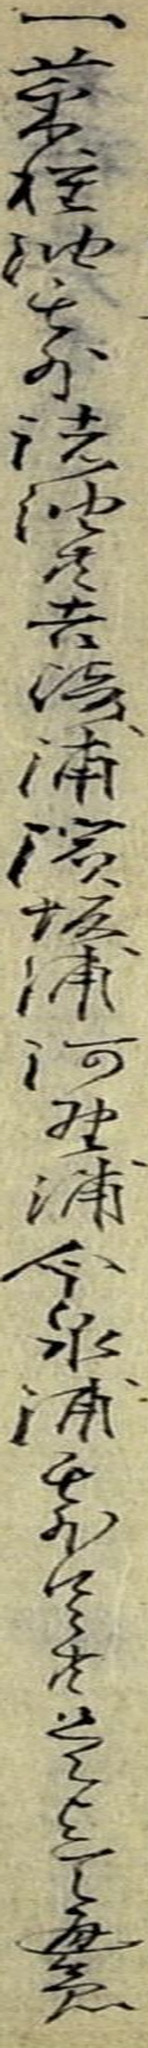一菜種油其外諸油共吉崎浦浜坂浦河野浦今泉浦其外口々共是迄之通急
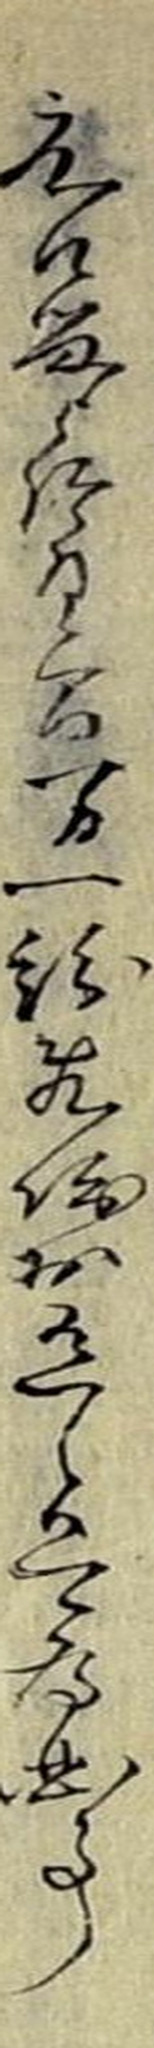度口留被仰付候間万一紛敷儀於有之は可為曲事候
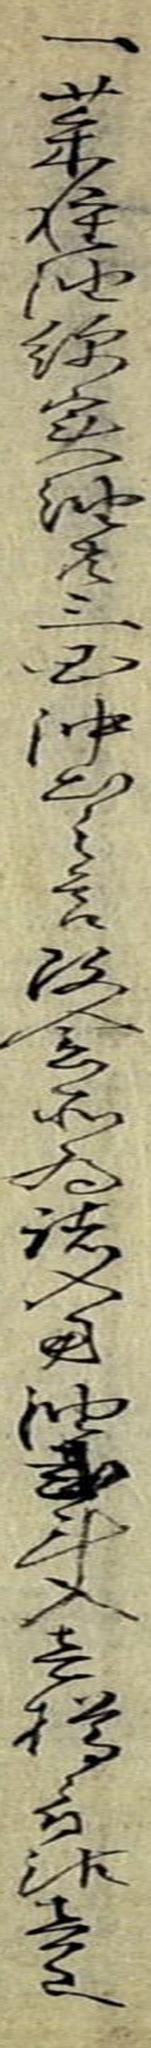一菜種油綿実油共三国沖出之節改会所為諸入用油弐斗入壱樽に付銀壱匁
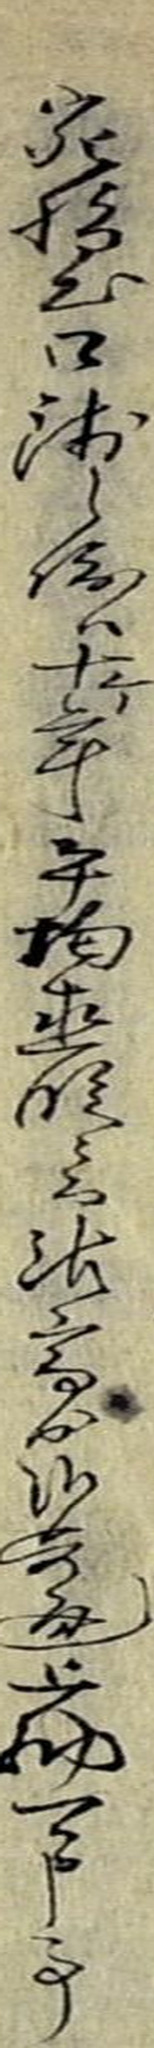宛指出口銭之儀は十ヶ年平均直段に而銀高ゟ弐歩通上納可申事
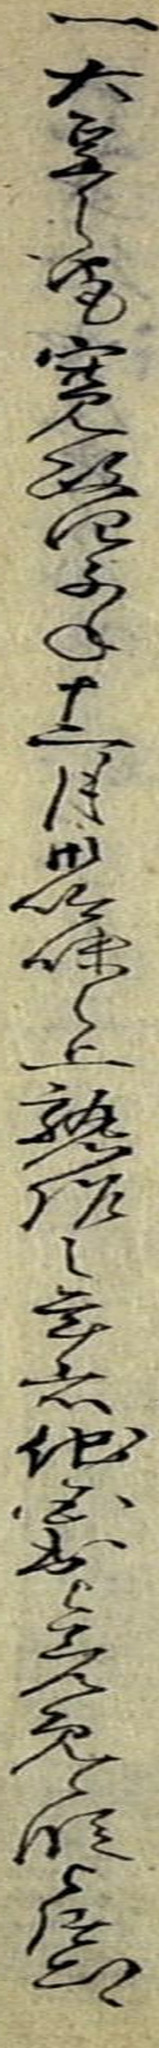一大豆之儀も寛政四子年十二月御吟味之上熟作之年者他国出被差免候段被仰出候
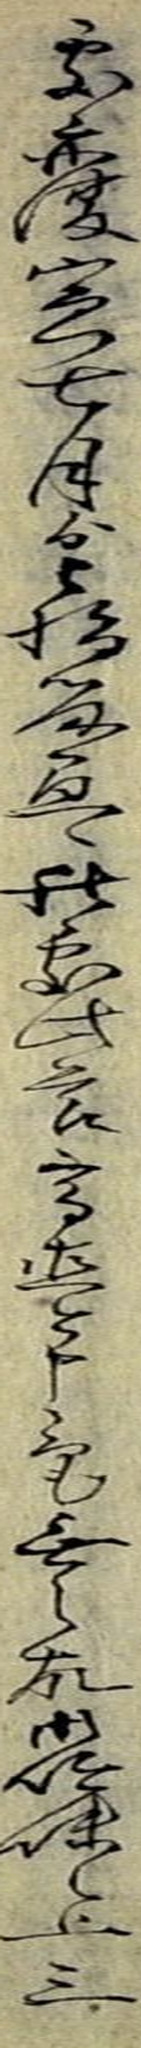処亦復寅七月ゟ被指留置候然処此節高直と申候而も無之故御吟味之上三
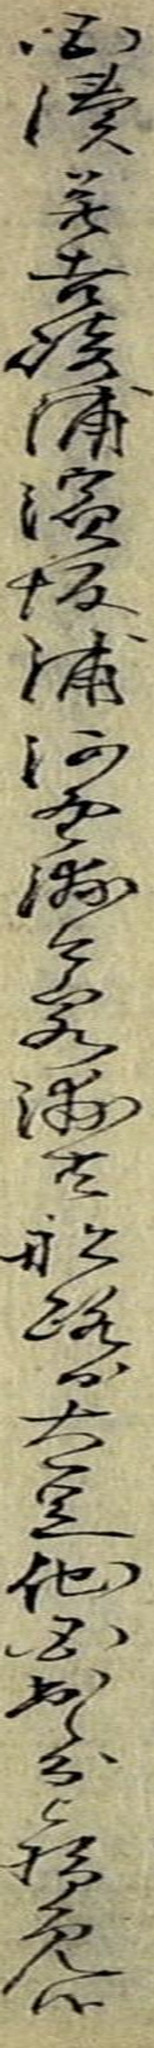国湊并吉崎浦浜坂浦河野浦今泉浦共船路ゟ大豆他国出し分被指免候
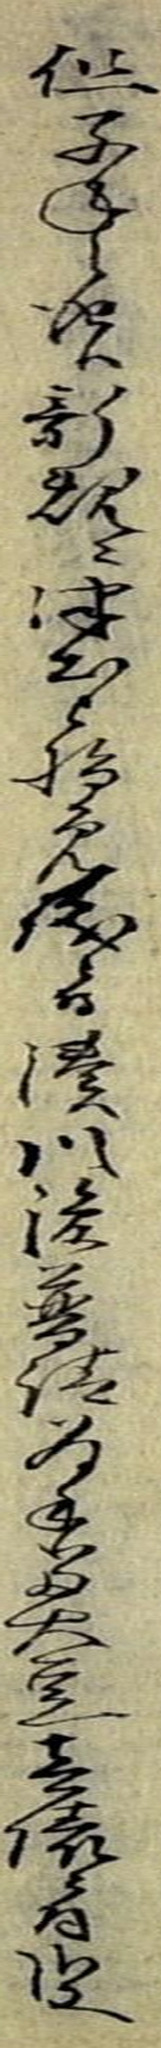但子年之儀は新規に津出被指免之儀に付湊川浚普請為手当大豆壱俵に付弐匁
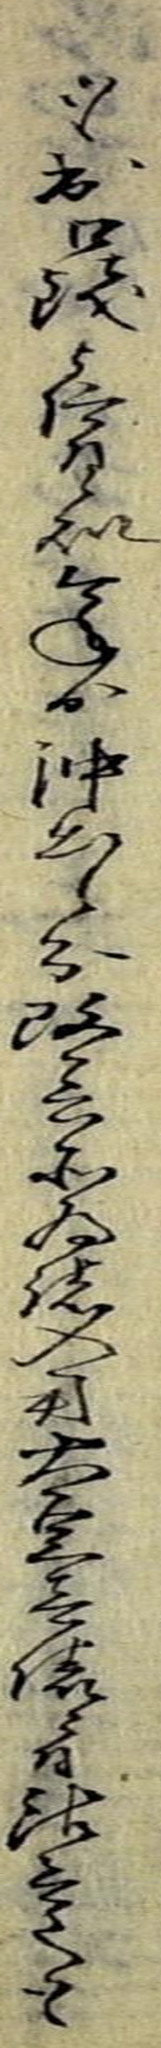つヽ出口銭被仰付候処今年ゟ沖出之分改会所為諸入用大豆壱俵に付銀壱匁つヽ
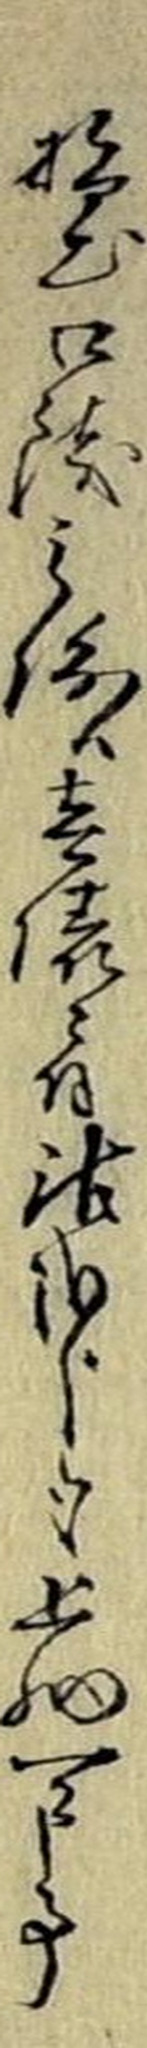指出口銭之儀は壱俵に付銀弐分つゝ上納可申事
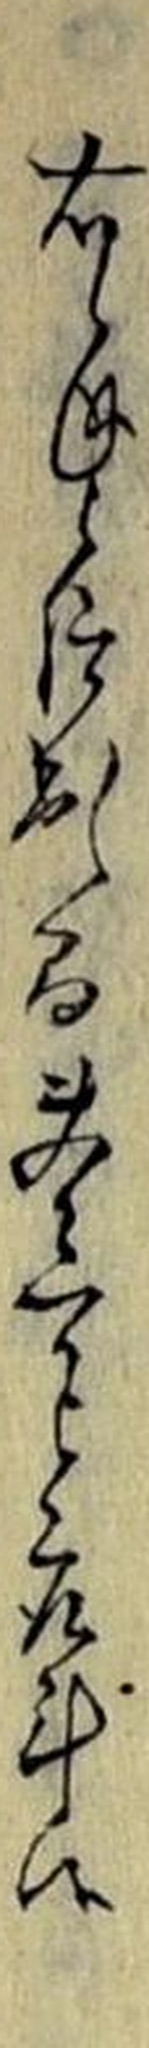右之趣被仰出候間夫々可被取斗候
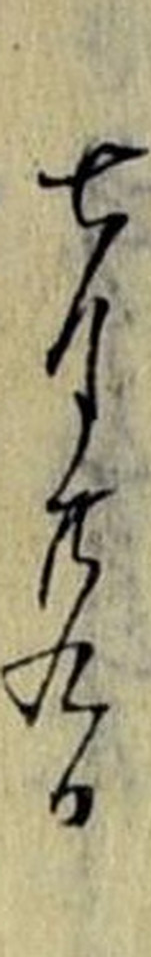七月廿九日
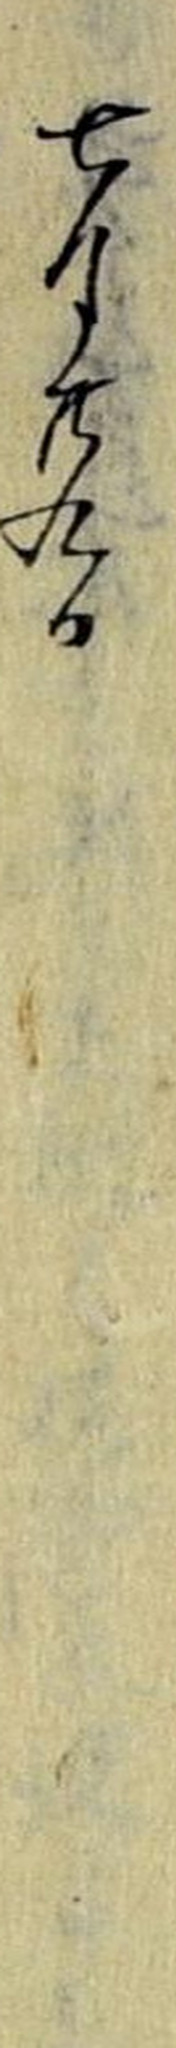七月廿九日
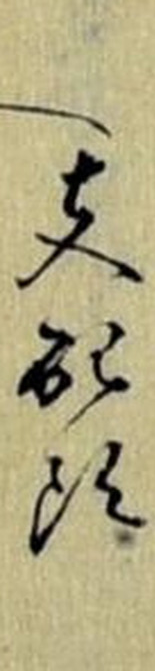支配頭
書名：命令之部 四
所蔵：福井県文書館 Fukui Prefectural Archives
